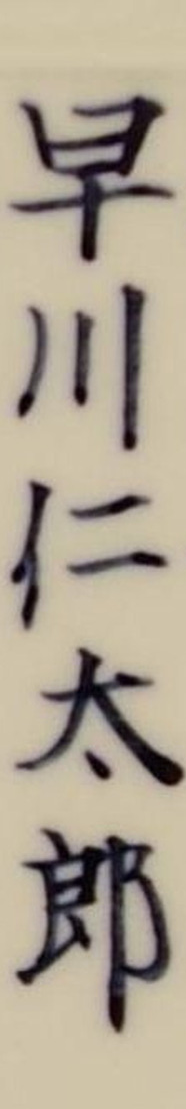早川仁太郎
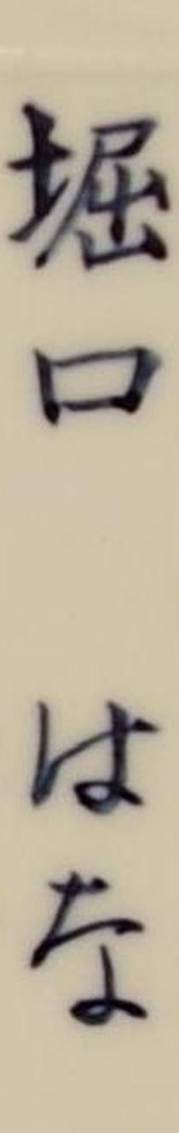堀口はな
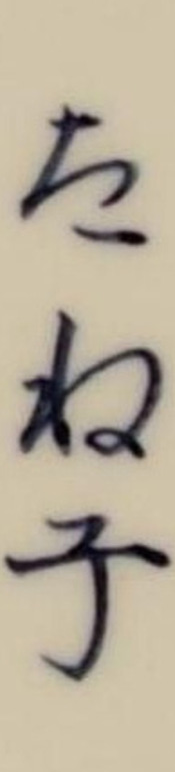たね子
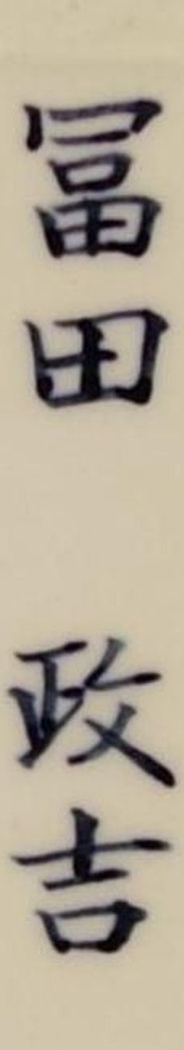冨田政吉
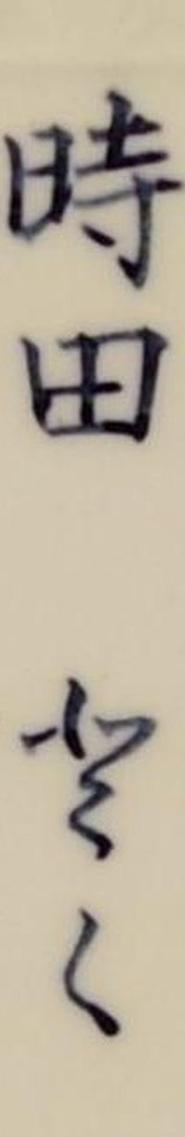時田とく
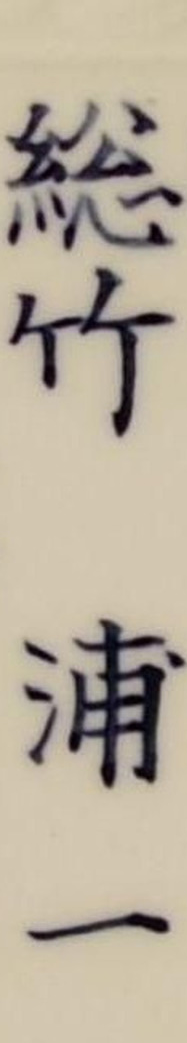総竹浦一
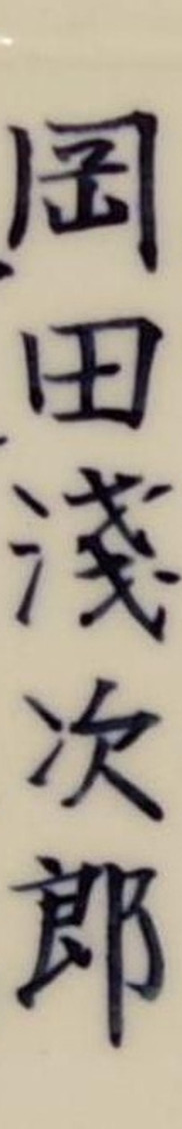岡田浅次郎
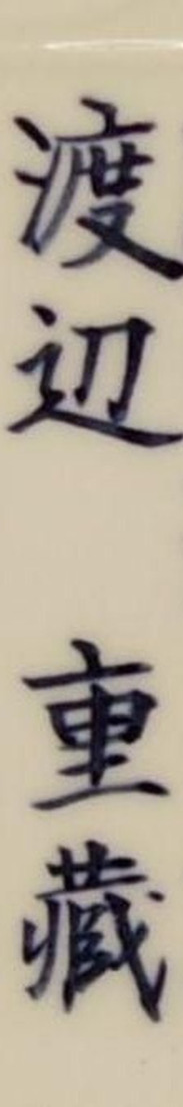渡辺重蔵
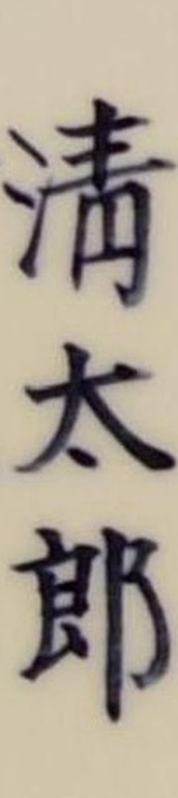清太郎
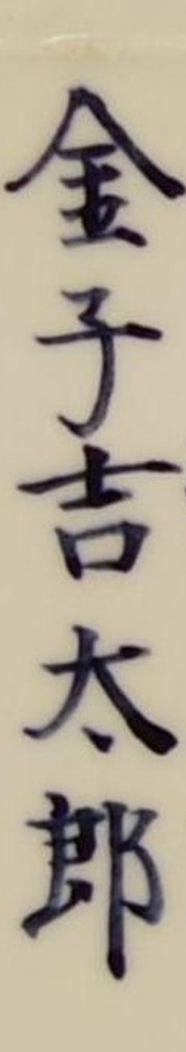金子吉太郎
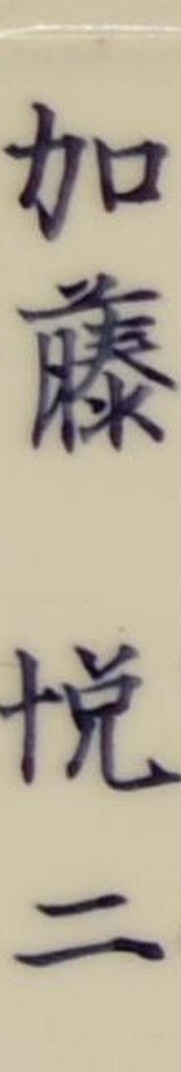加藤悦二
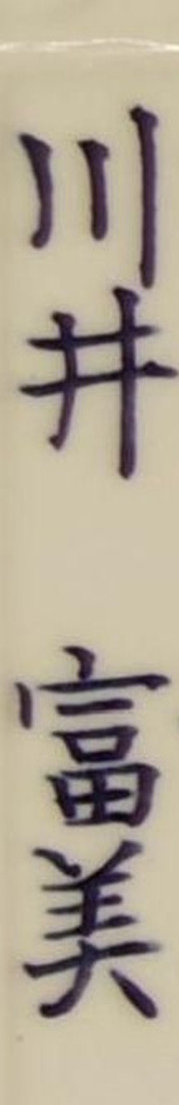川井富美

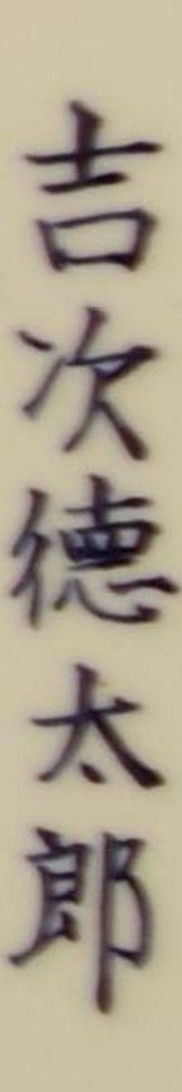吉次徳太郎
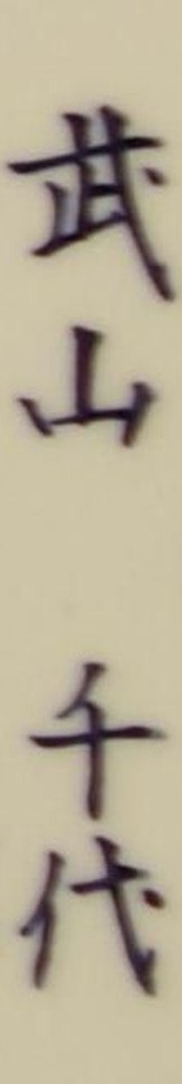武山千代
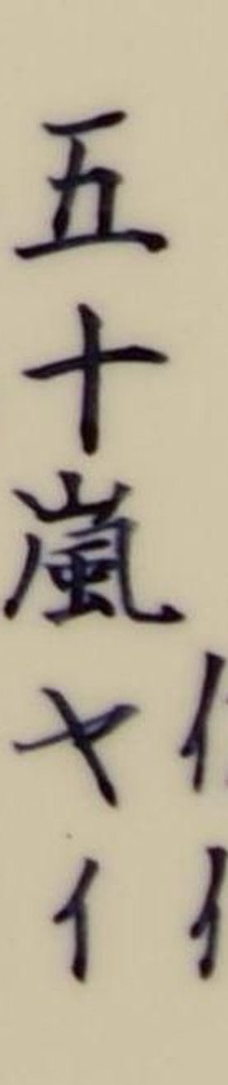五十嵐ヤイ
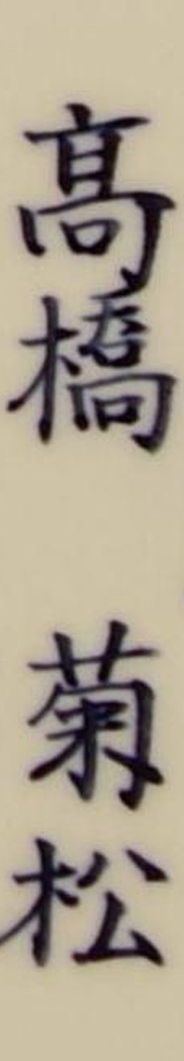高橋菊松
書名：E~L
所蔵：高野山金剛峯寺
